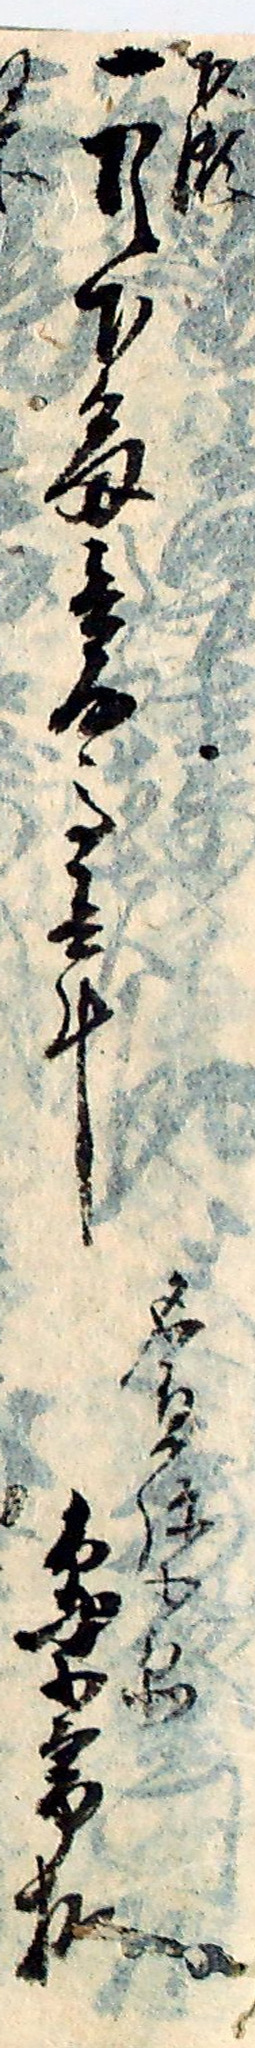一下々下畠壱反高壱斗象五郎扣
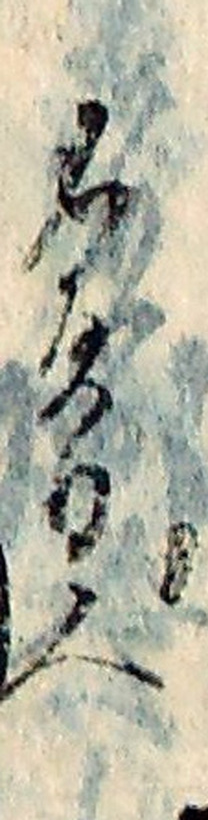名負同人
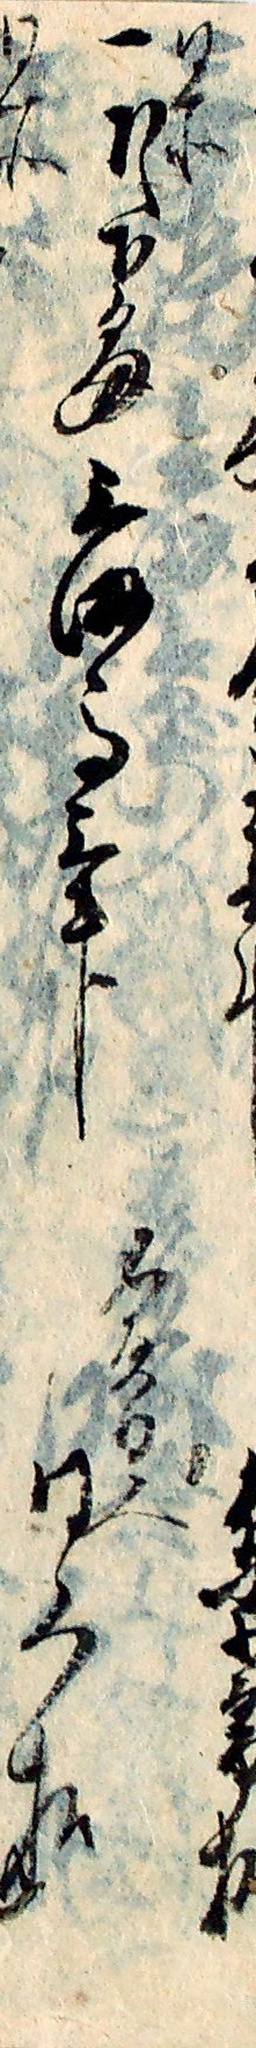一下々下畠三畝高三升同人扣
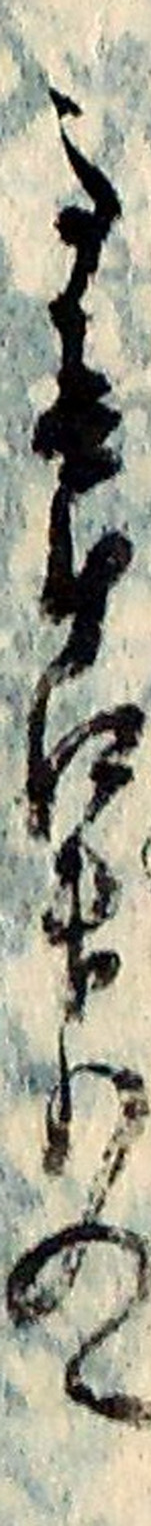高壱斗四升五合
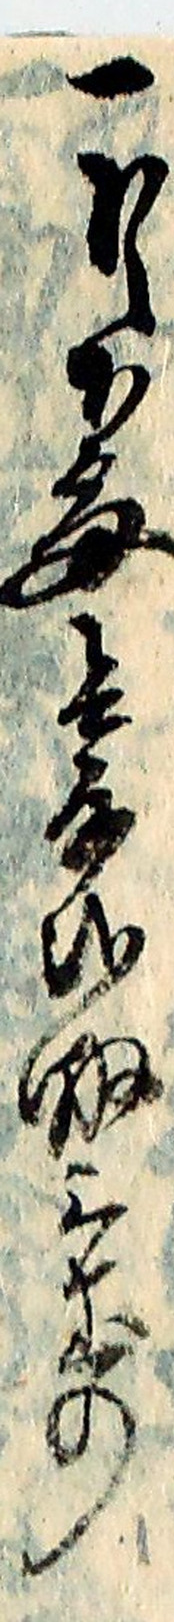一下々下畠壱反弐畝三歩同人扣
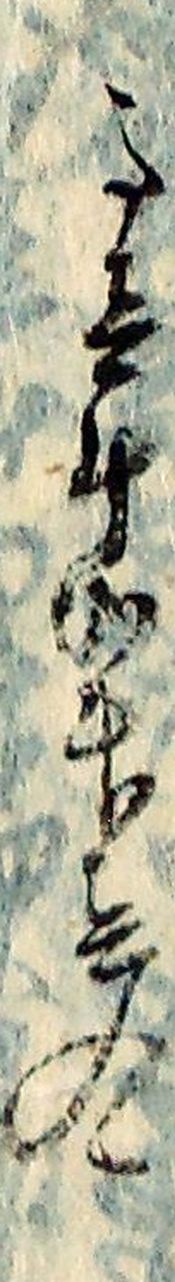高壱斗弐升壱合
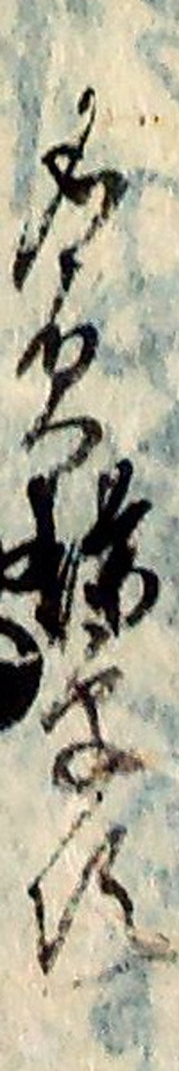名負弥平次
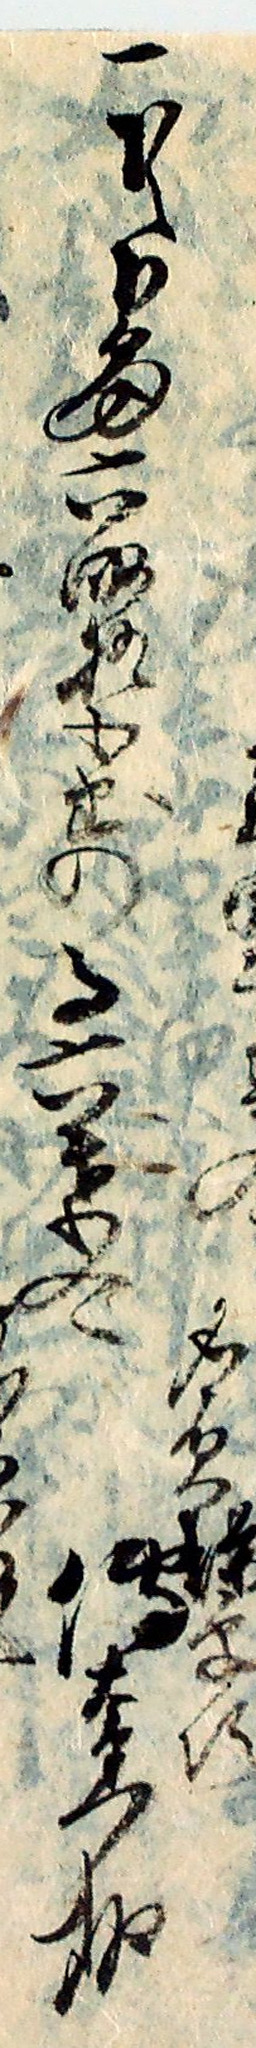一下々下畠六畝拾五歩高六升五合伝右衛門扣
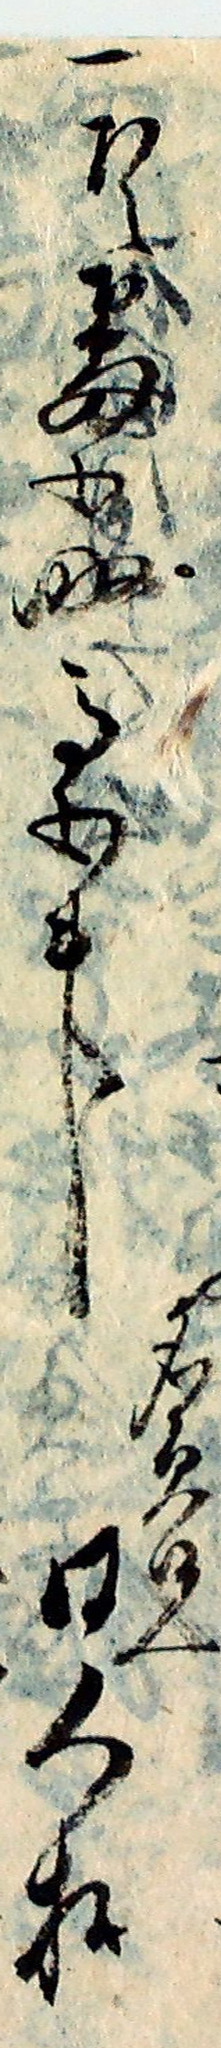一下々下畠五畝高五升同人扣
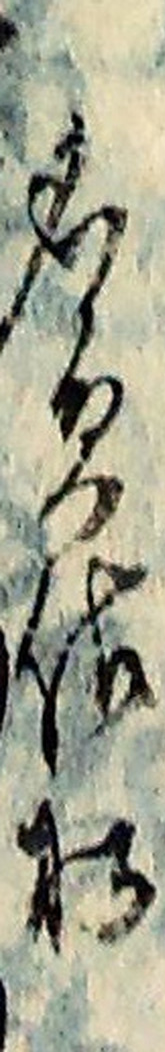名負佐蔵
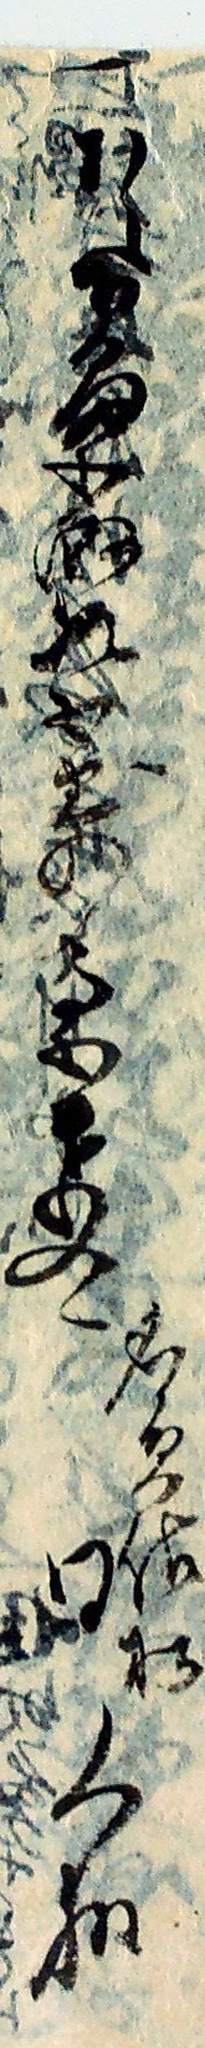一下々下畠五畝拾五歩高五升五合同人扣
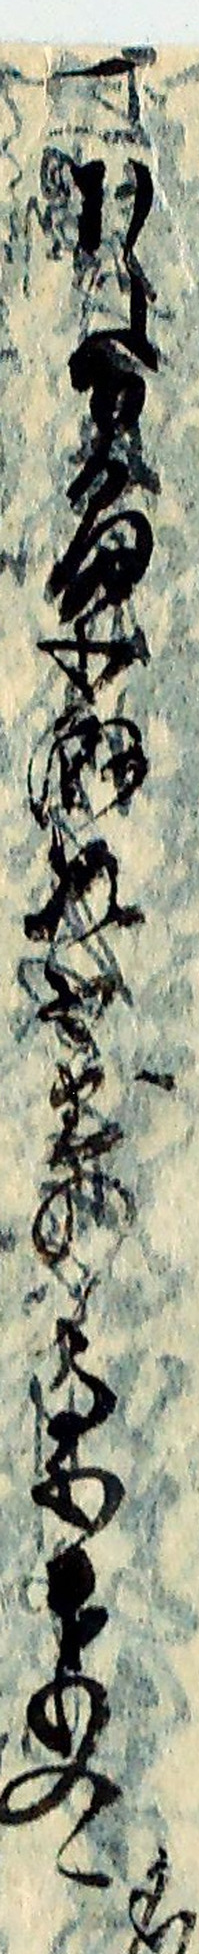一下々下畠五畝拾五歩高五升五合同人扣
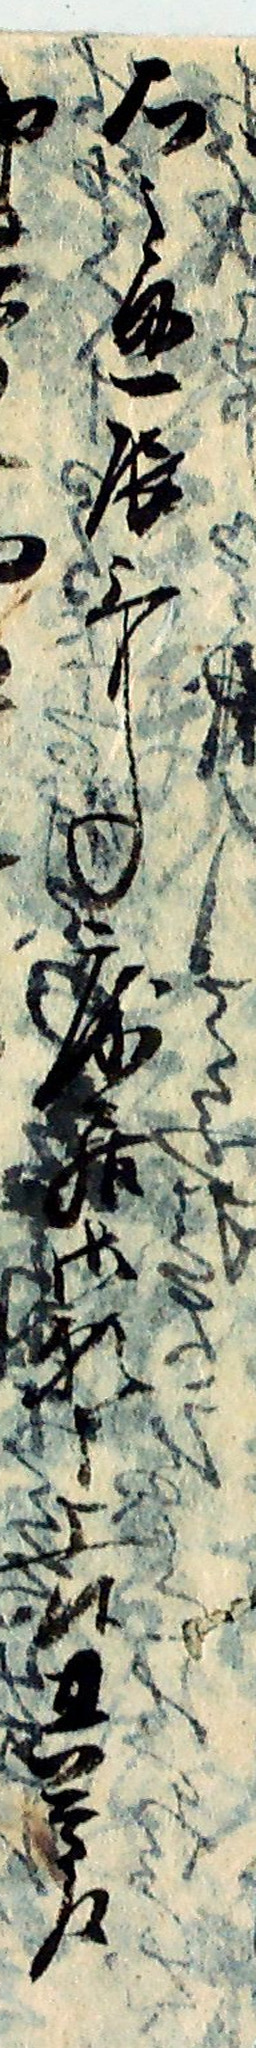右之通辰三月床居御願申上候其節
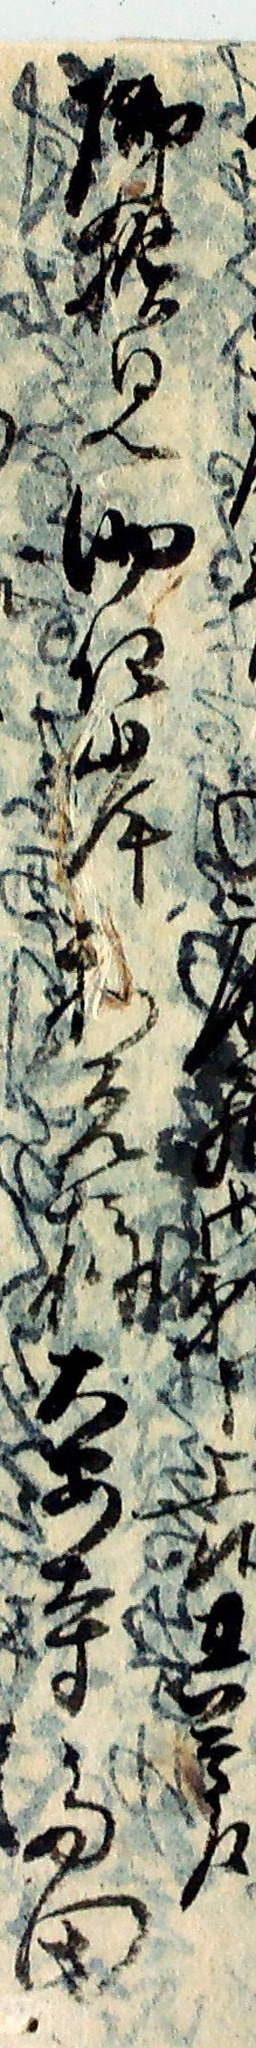御検見助任岸利光様大安寺高田
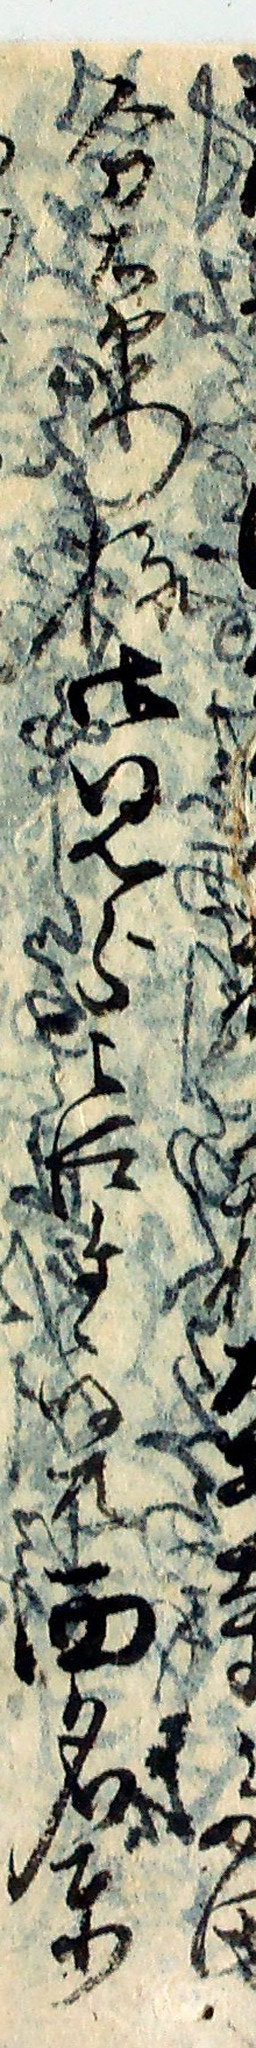分右衛門様御見分被仰付候得共西名東

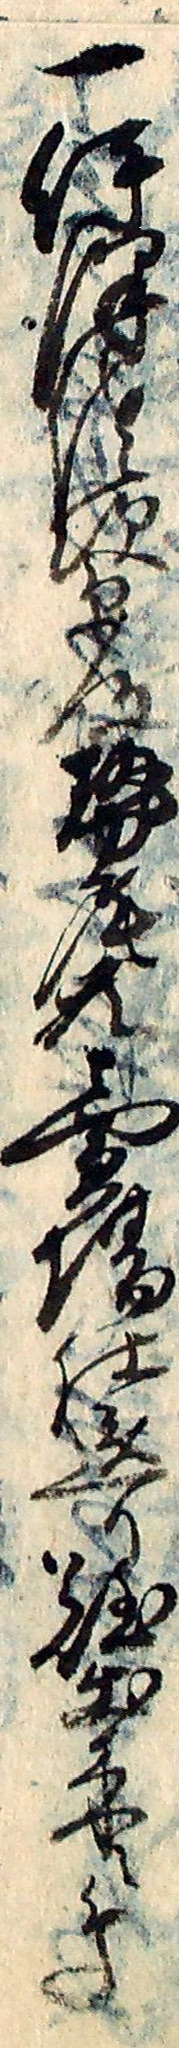一伊沢佐次兵衛殿勢尾共売場仕送り難出来に付
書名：諸御願書控(後藤氏壱番）
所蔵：鳴門教育大学 Naruto University of Education
